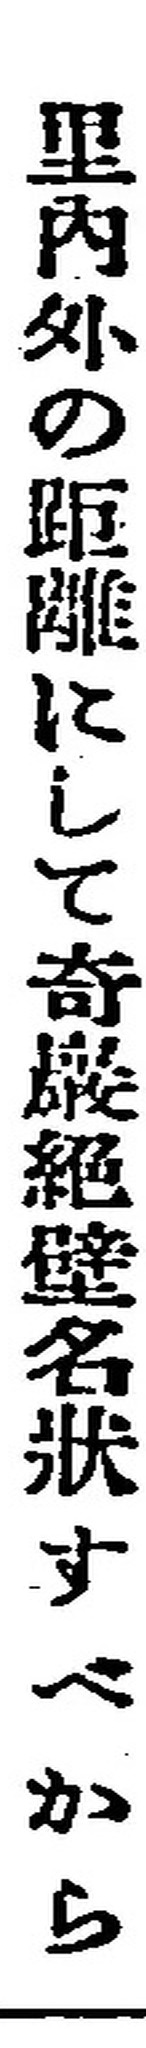里内外の距離にして奇巌絶壁名状すべから
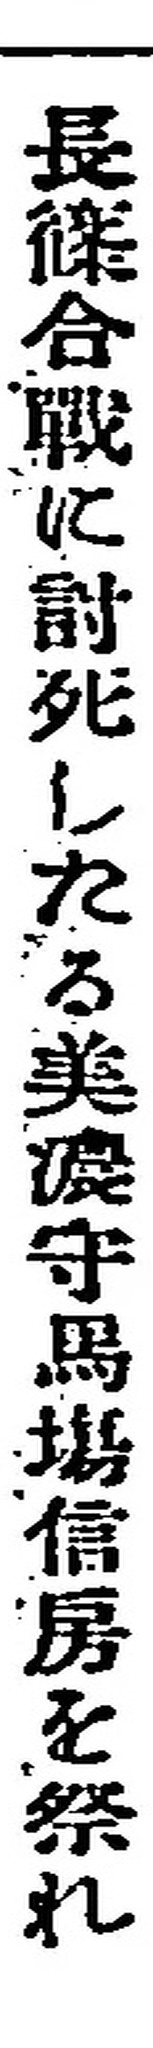長篠合戦に討死したる美濃守馬場信房を祭れ
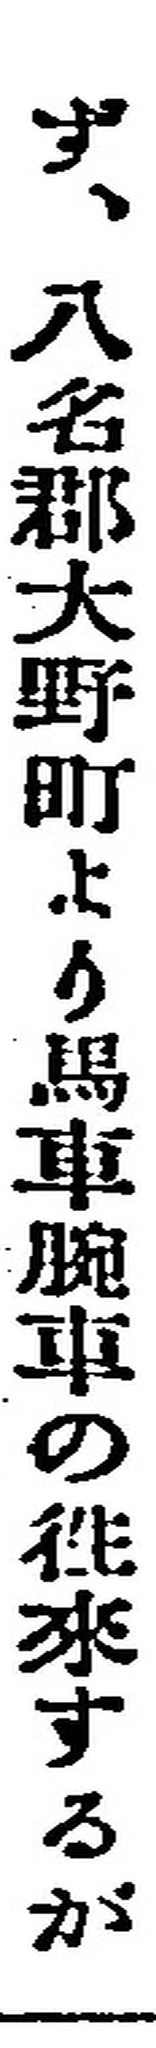ず、八名郡大野町より馬車腕車の往来するが
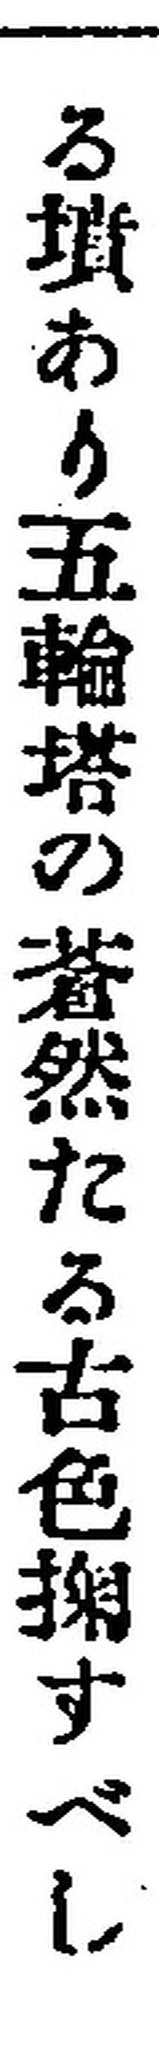る墳あり五輪塔の蒼然たる古色掬すべし
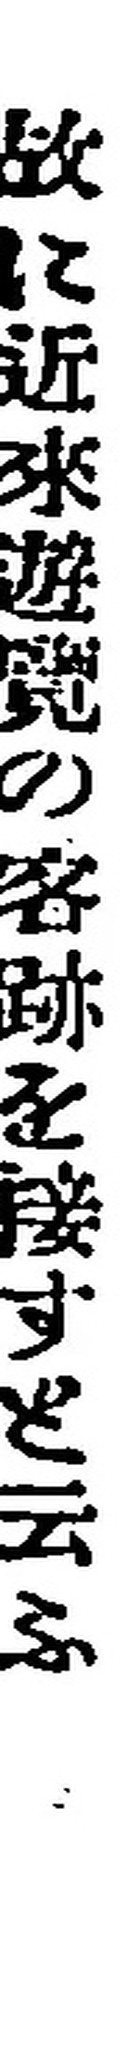故に近来遊覧の客跡を接すと云ふ
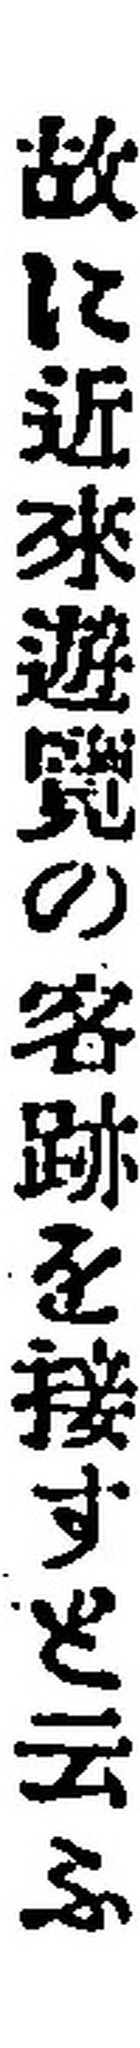故に近来遊覧の客跡を接すと云ふ
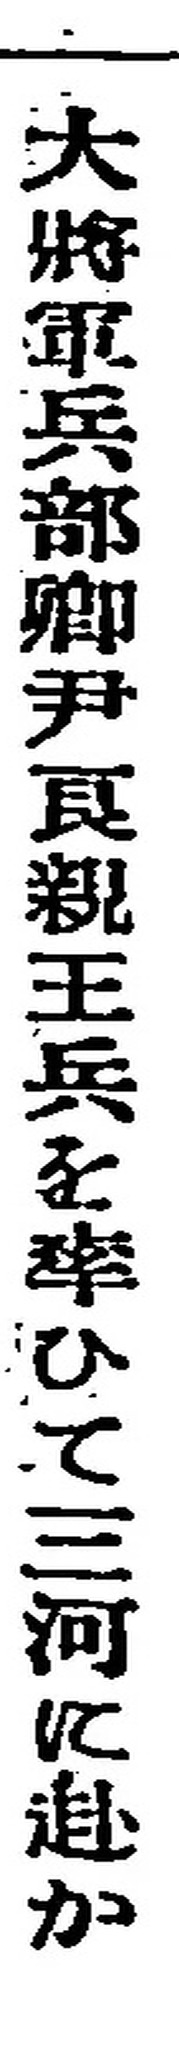大将軍兵部卿尹良親王兵を率ひて三河に赴か
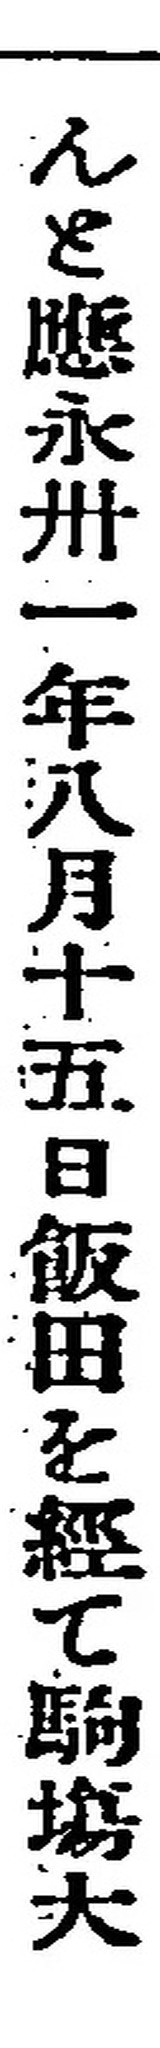んと応永卅一年八月十五日飯田を経て駒場大
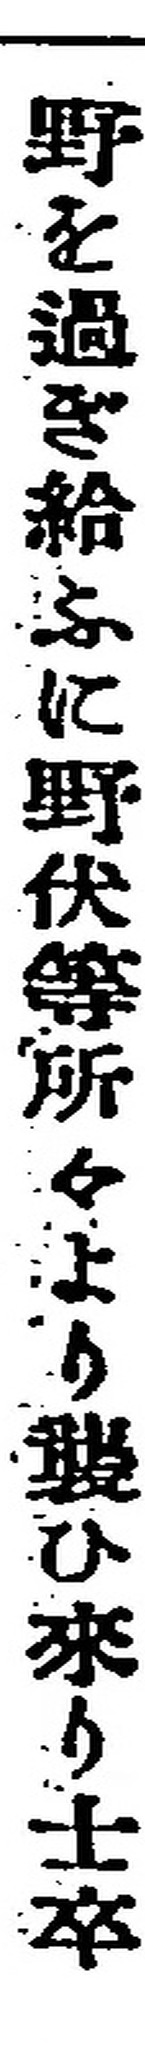野を過ぎ給ふに野伏等所々より襲ひ来り士卒
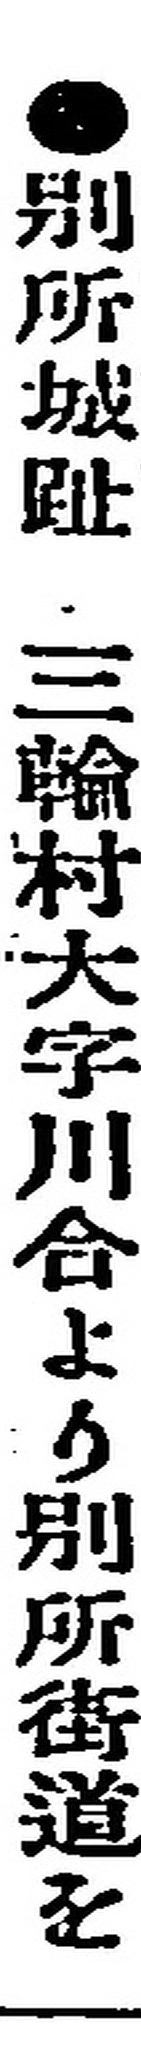●別所城趾三輪村大字川合より別所街道を
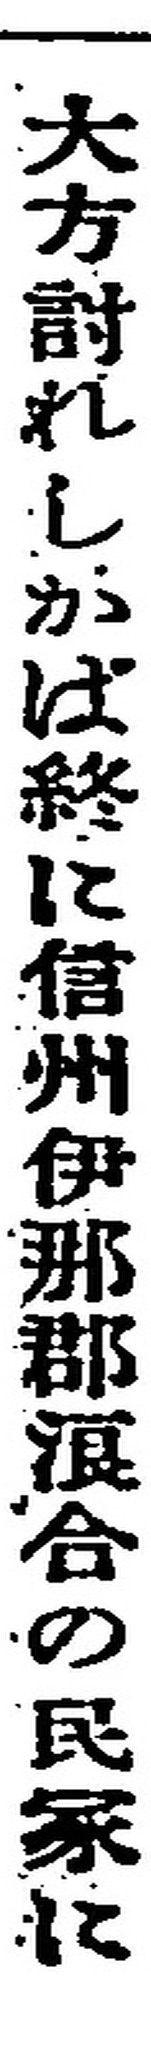大方討れしかば終に信州伊那郡浪合の民家に
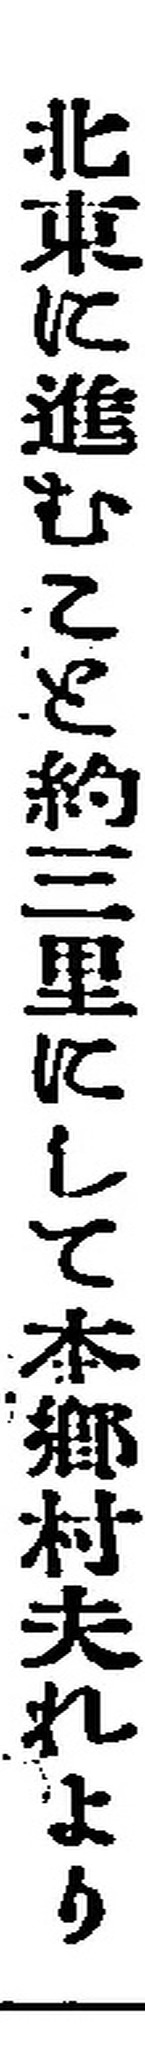北東に進むこと約三里にして本郷村夫れより
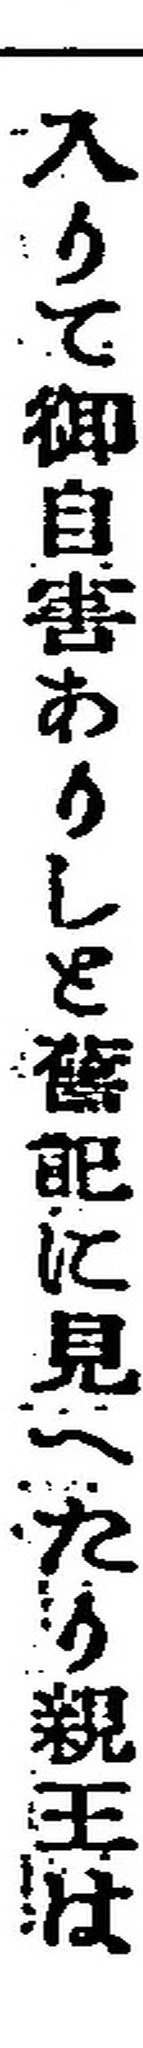入りて御自害ありしと旧記に見へたり親王は
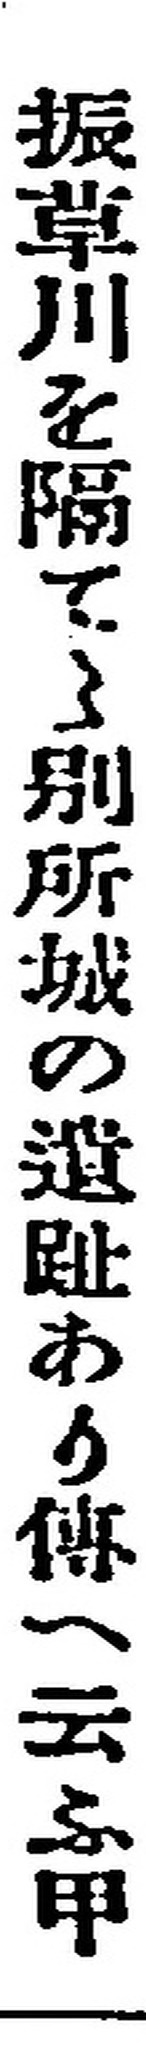振草川を隔てゝ別所城の遺趾あり伝へ云ふ甲
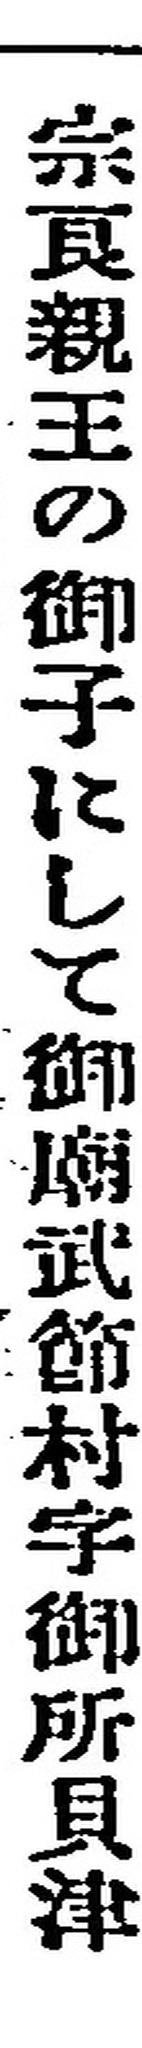宗良親王の御子にして御廟武節村字御所貝津
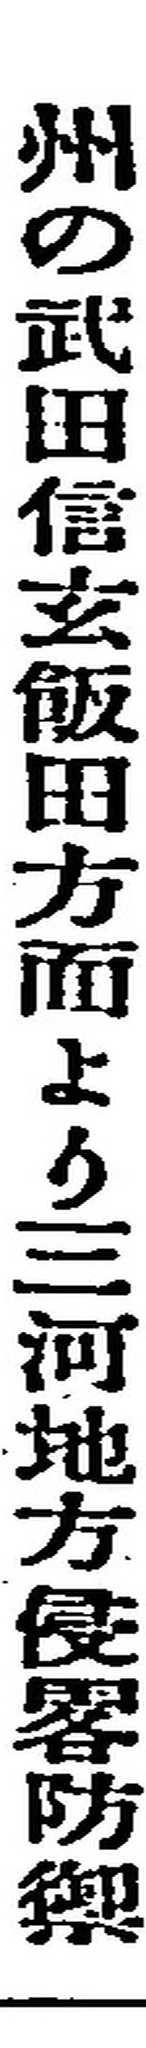州の武田信玄飯田方面より三河地方侵略防禦
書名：東参名勝案内
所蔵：国立国会図書館 National Diet Library, JAPAN
